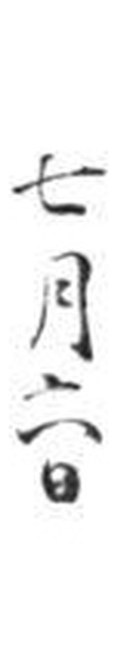七月六日
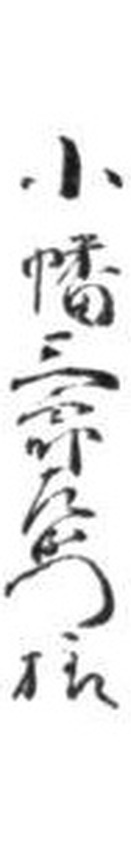小幡三郎左衛門様
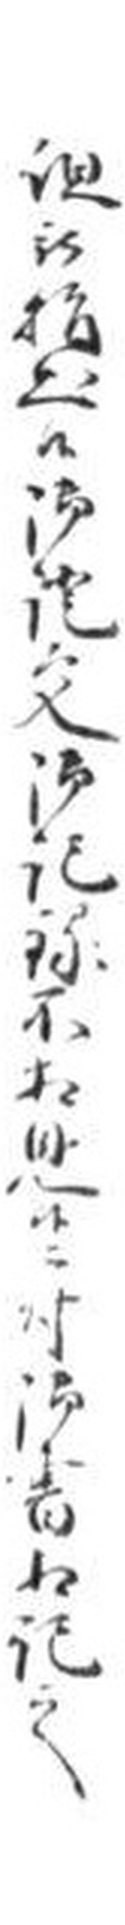但被指出候御証文御記録不相見候ニ付御書相記之
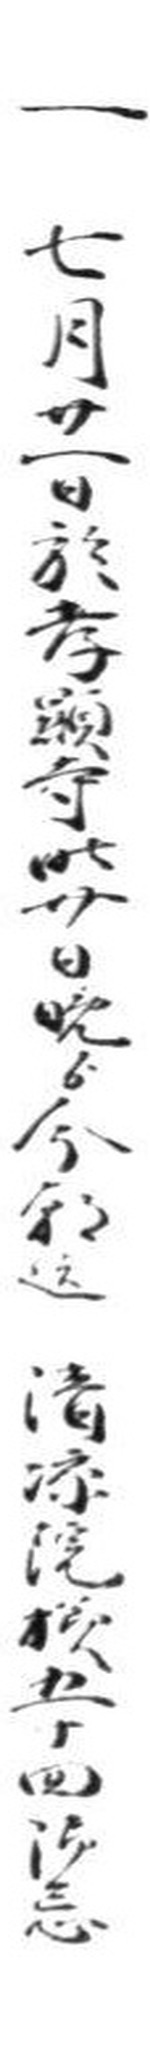一七月廿一日於孝顕寺昨廿日晩ゟ今朝迄清涼院様五十回御忌
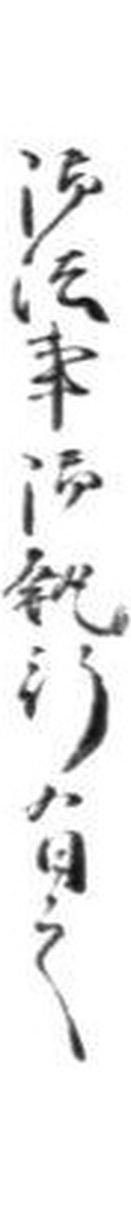御法事御執行有之
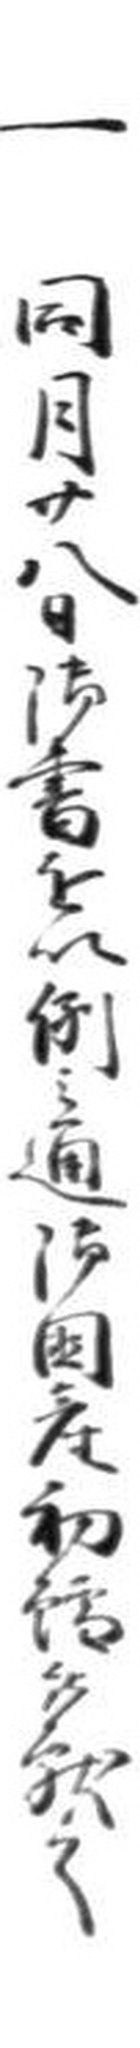一同月廿八日御書を以例之通御国産初鱈被献之
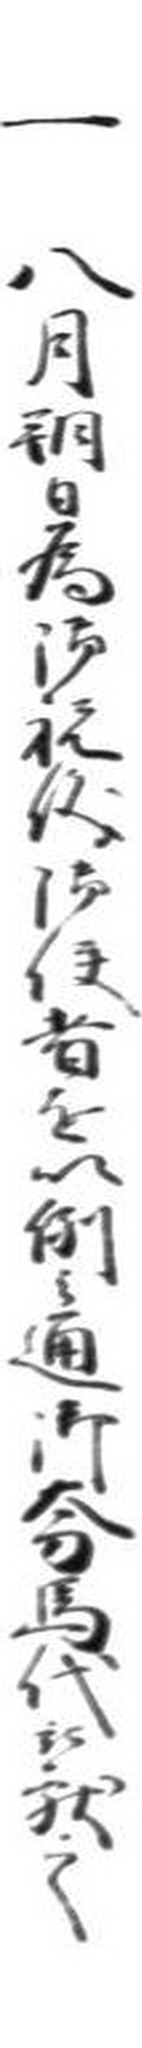一八月朔日為御祝儀御使者を以例之通御太刀馬代被献之
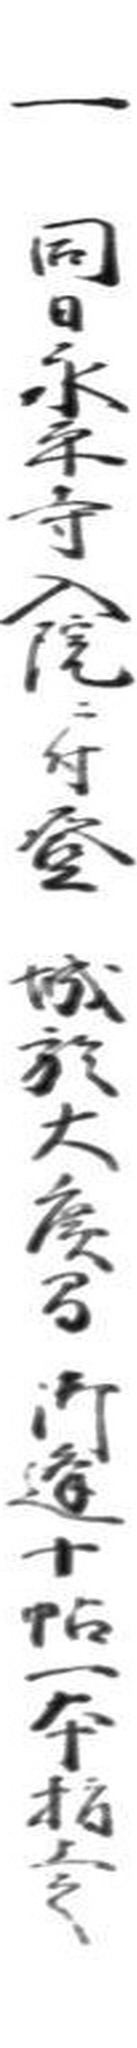一同日永平寺入院ニ付登城於大広間御逢十帖一本指上之
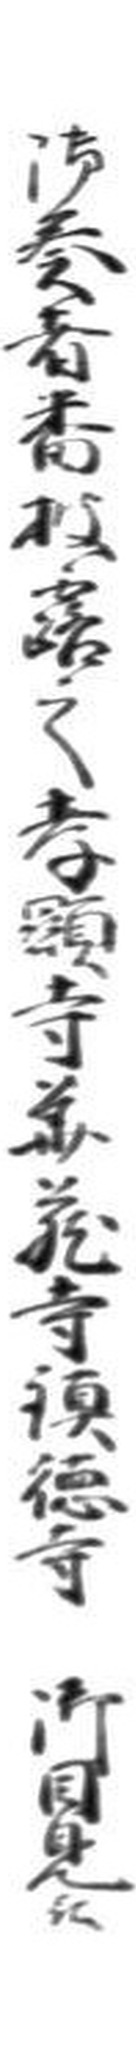御奏者番披露之孝顕寺華蔵寺鎮徳寺御目見被
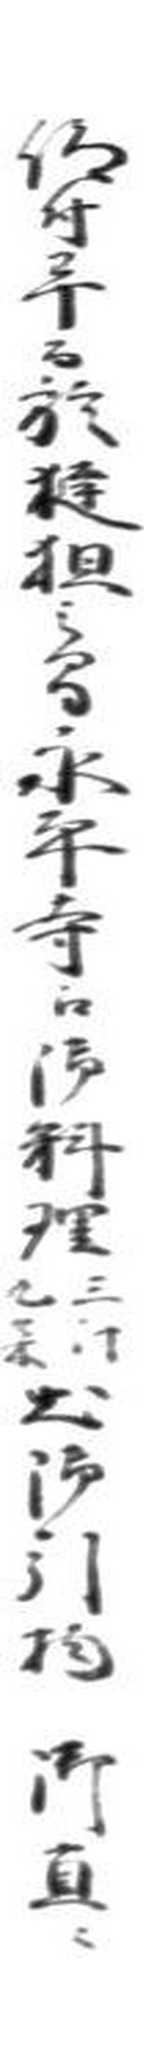仰付畢而於韃靼之間永平寺江御料理三汁九菜出御引物御直ニ
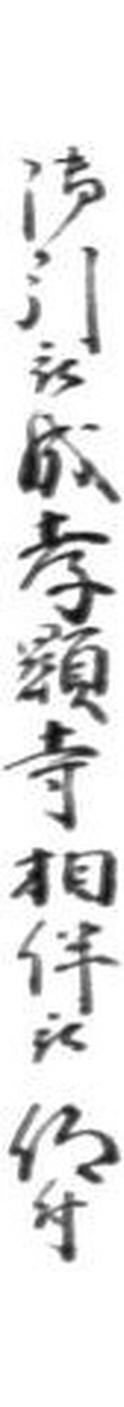御引被成孝顕寺相伴被仰付
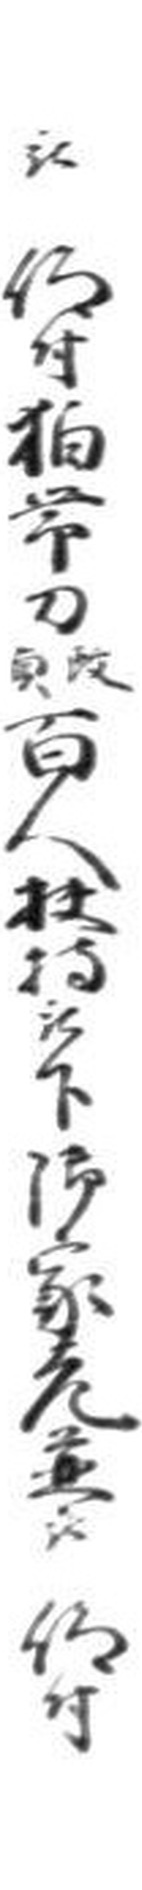被仰付狛帯刀政貞百人扶持被下御家老並被仰付

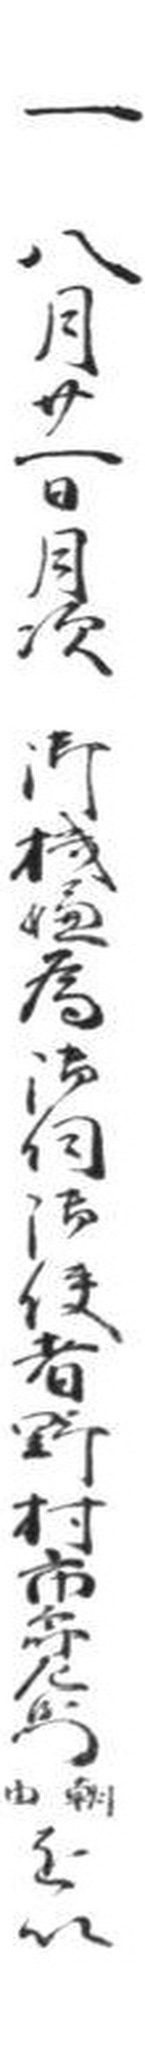一八月廿一日月次御機嫌為御伺御使者野村市郎左衛門朝由を以
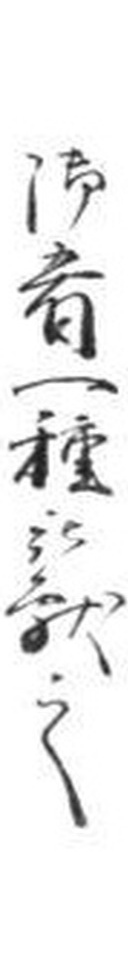御肴一種被献之
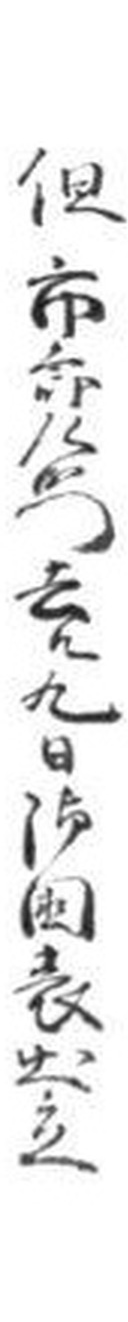但市郎左衛門去ル九日御国表出立
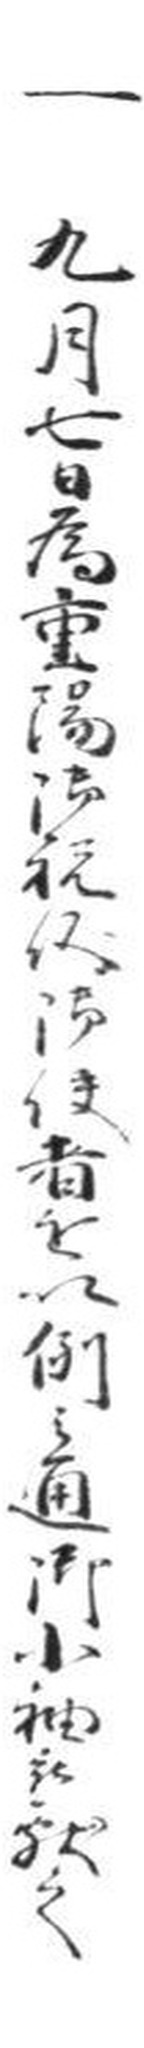一九月七日為重陽御祝儀御使者を以御小袖被献之
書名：家譜 十七 吉品公 従元禄元年到同二年
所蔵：福井県文書館 Fukui Prefectural Archives
